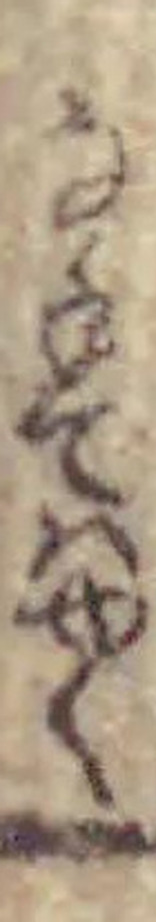な手てはゆく
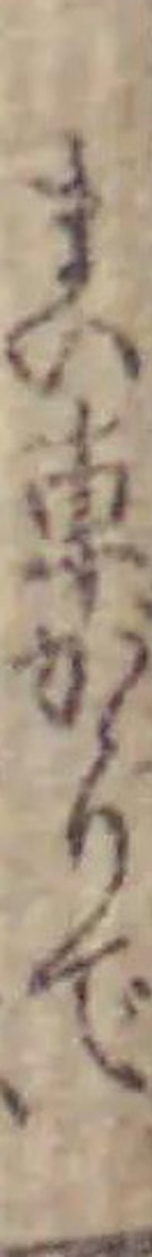まい車がゝりで
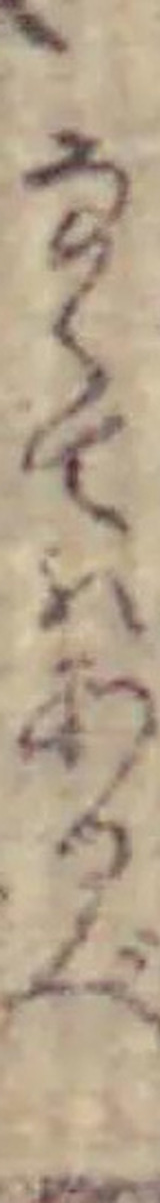なくてはあるべ
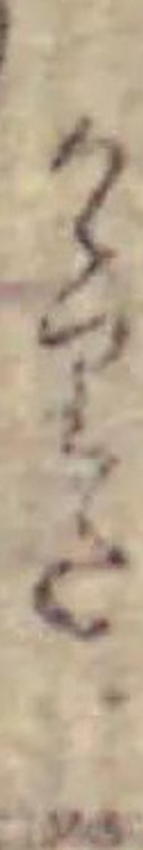かゝりだ
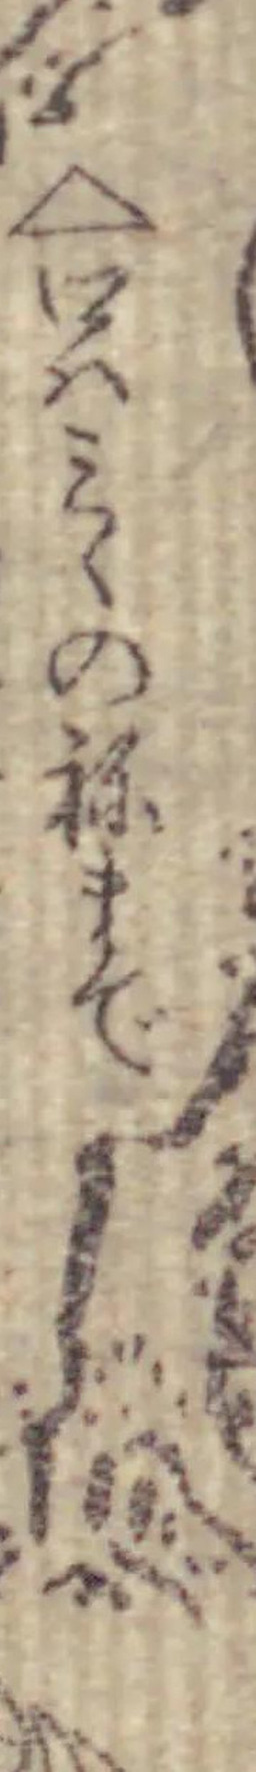△口はみゝのねまで
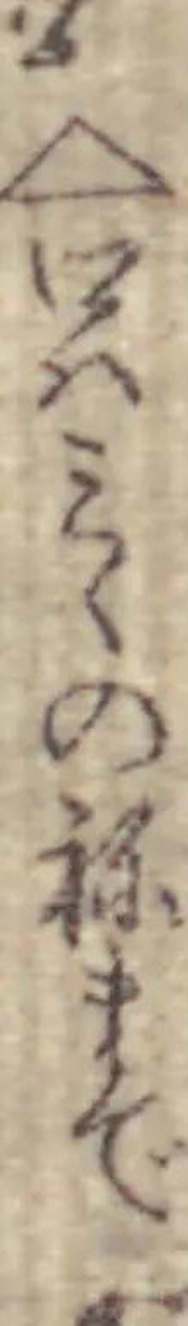△口はみゝのねまで
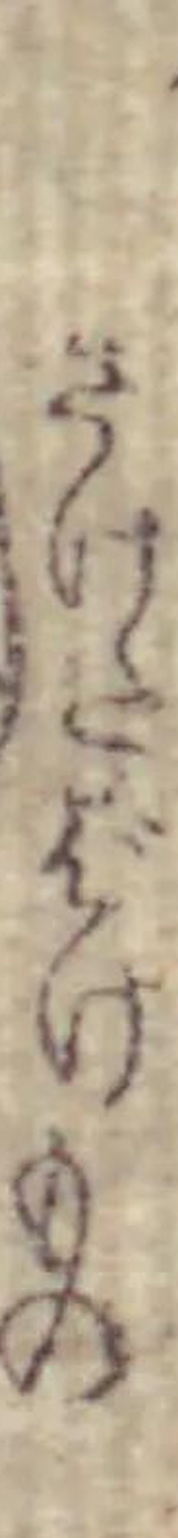さけたばけもの
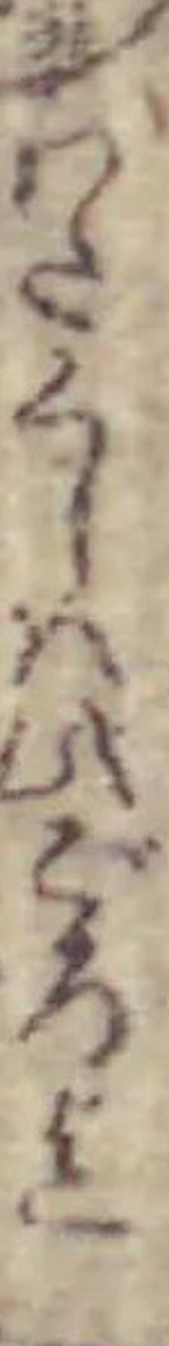わたくしは此ごろ迄
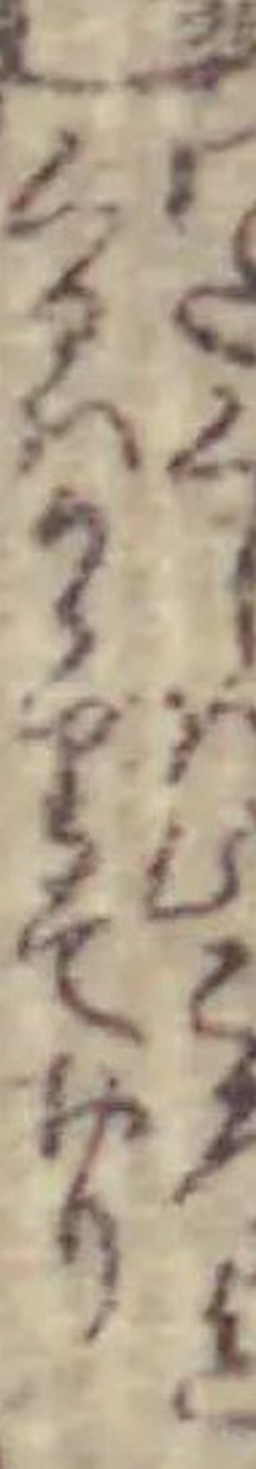くるはかゝりており
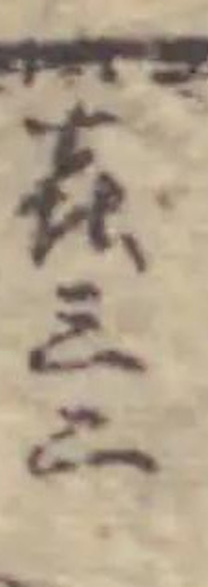喜三二
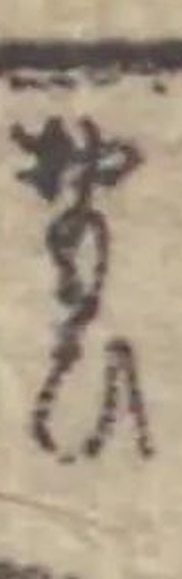おもひ
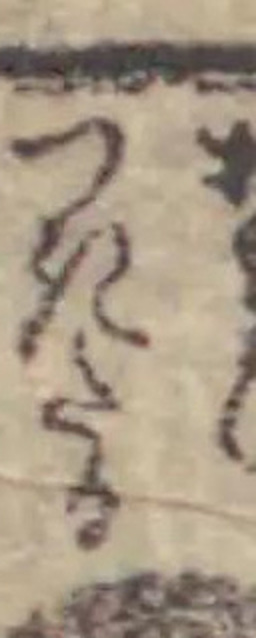つきたる
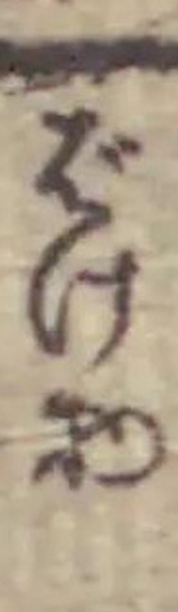ばけ物
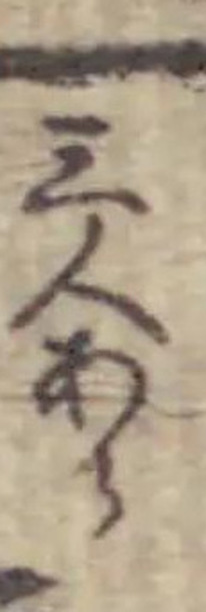三人あら
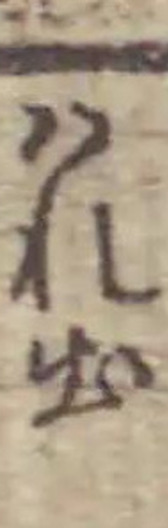はれ出
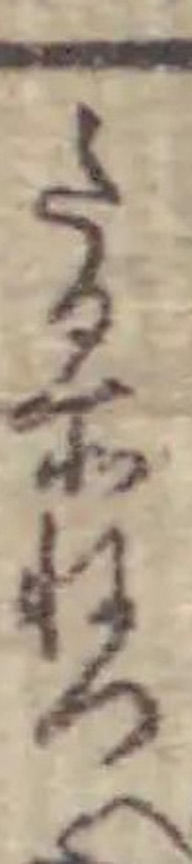たる所ねつ
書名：亀山人家妖 3巻
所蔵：国立国会図書館 National Diet Library, JAPAN
